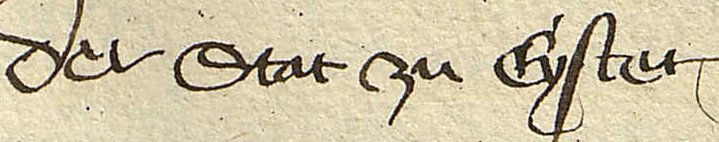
Der Stat cʒu Eyſtet
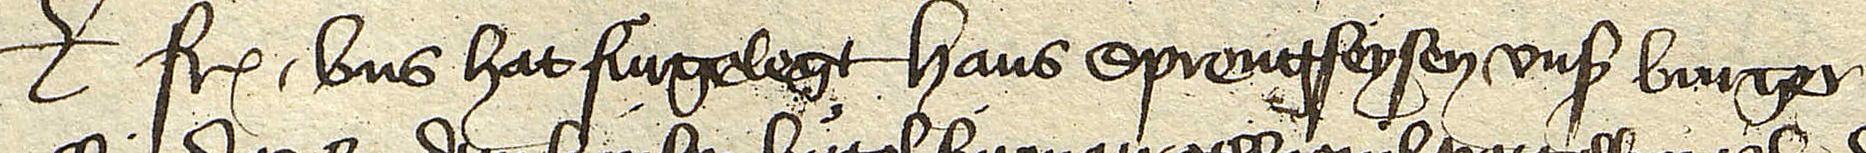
L* fr* / vns hat fürgelegt hans Sprengſeyſen vnſ* burger
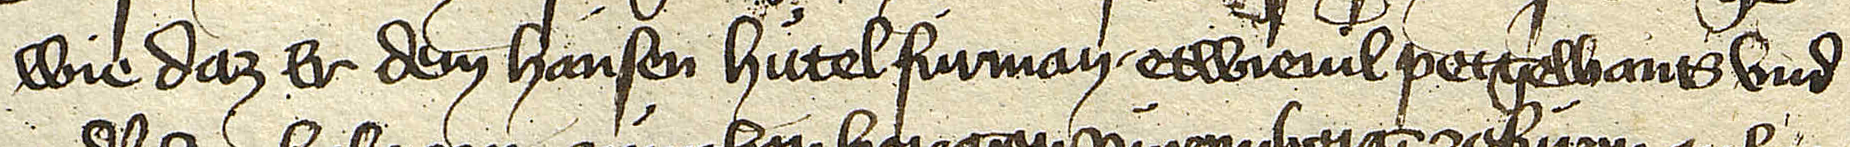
wie daʒ Er dem hanſen hütel fürman / etwieuil petgewants vnd
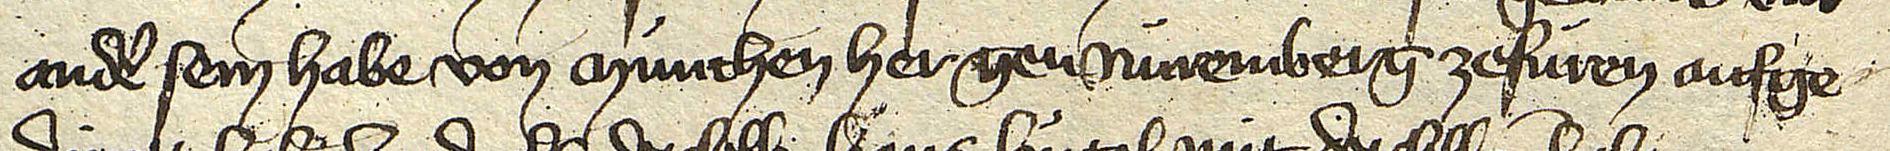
ande* ſein habe von München her gen Nüremberg ʒefüren aufge =
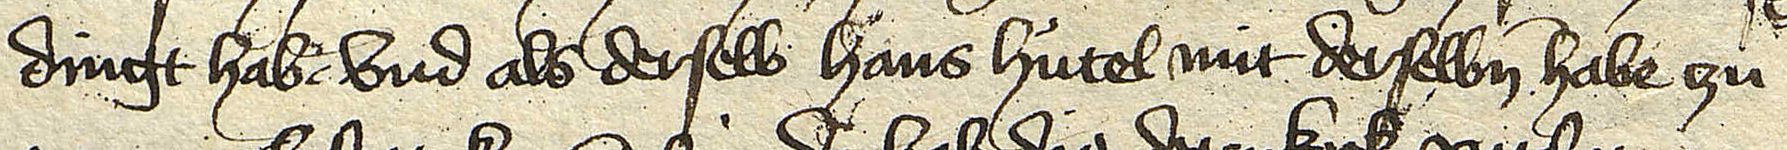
dingt hab / vnd als derſelb hans hütel mit derſelbn* habe cʒu
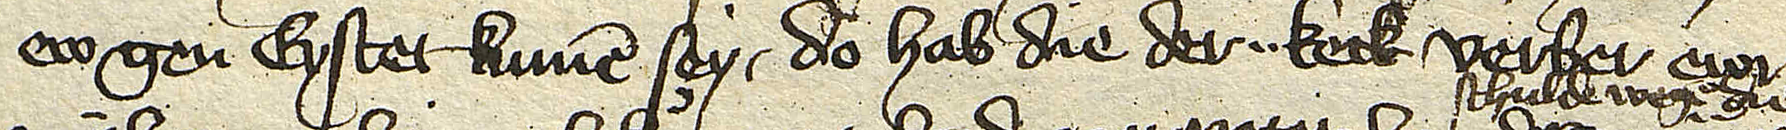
ew gen Eyſtet kume* ſey / do hab die der ~ keck verber ewr
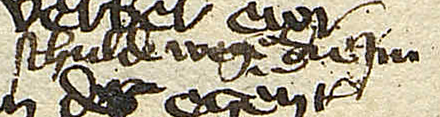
ſchulde wege* die Im
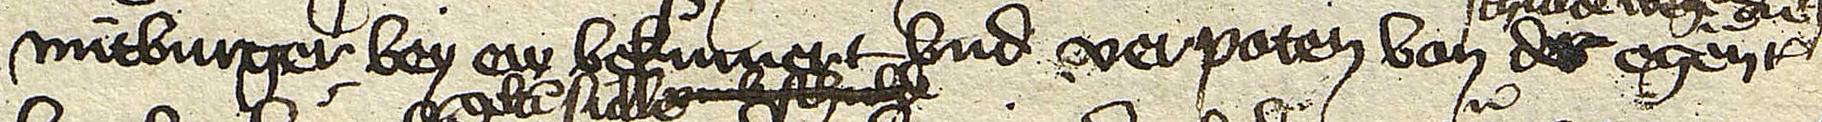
mitburger bey ew bekümert vnd verpoten von des egen*t*
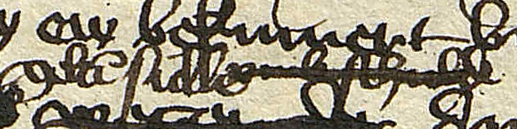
gelte* ſülle vmb ſchulde
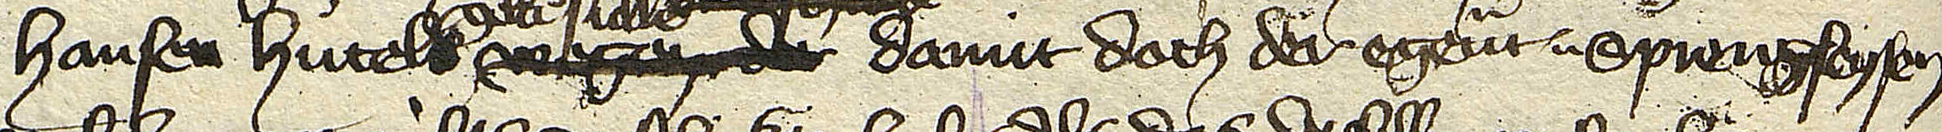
hanſen hütels wegen der damit doch der egen*t* ~ Sprengſeyſen
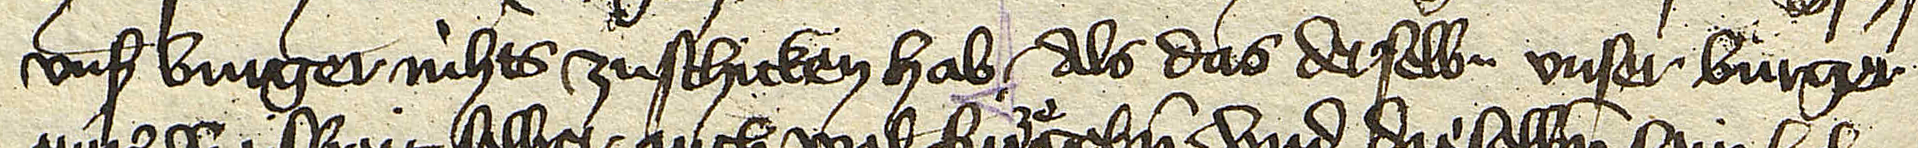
vnſ* burger nihts cʒuſchicken hab / Als das derſelb* ~ vnſer burger
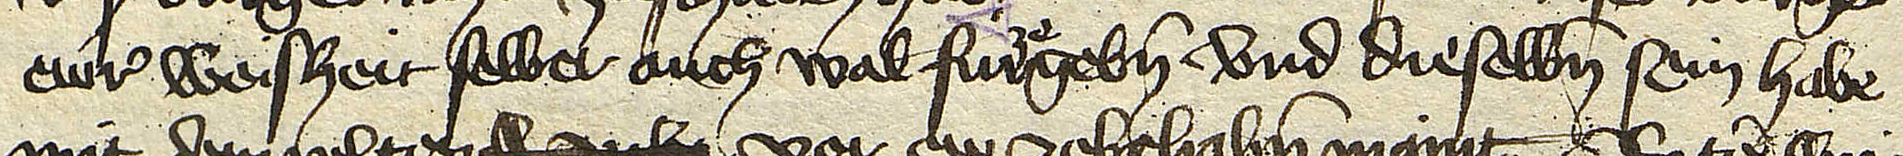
ewr* weiſheit ſelber auch wol fürgebn* / vnd dieſelbn* ſein habe
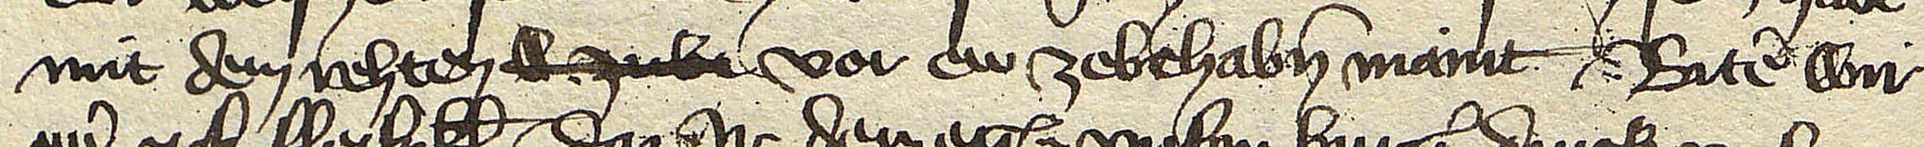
mit dem rehten b cʒub vor ew cʒebehabn* maint / Bite* wir
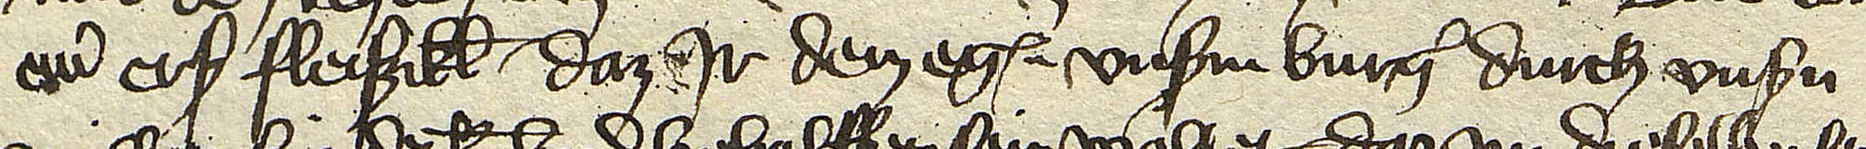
ew* erſ* fleiſʒikl* / daʒ Ir dem eg* ~ vnſ*m burg* durch vnſ*n
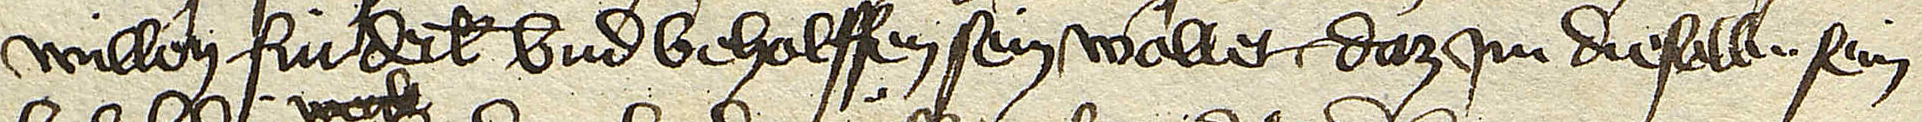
willen fürderl* vnd beholffen ſein wöllet / daʒ Im dieſelb ~ ſein
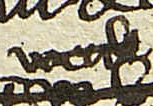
werde
